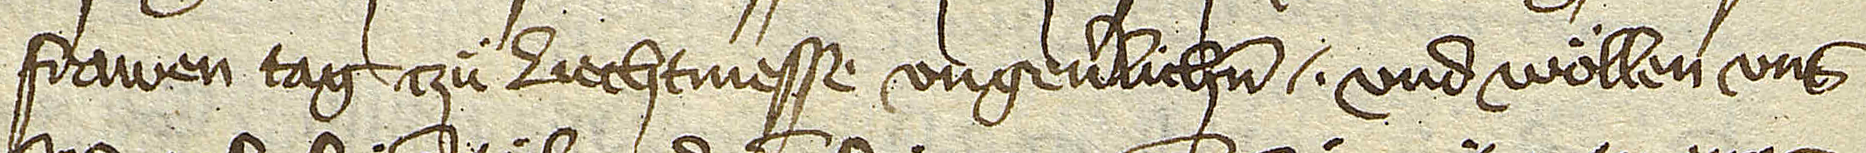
frawen tag cʒü Liechtmeſſe vngeu*lichn* / . vnd wöllen vns
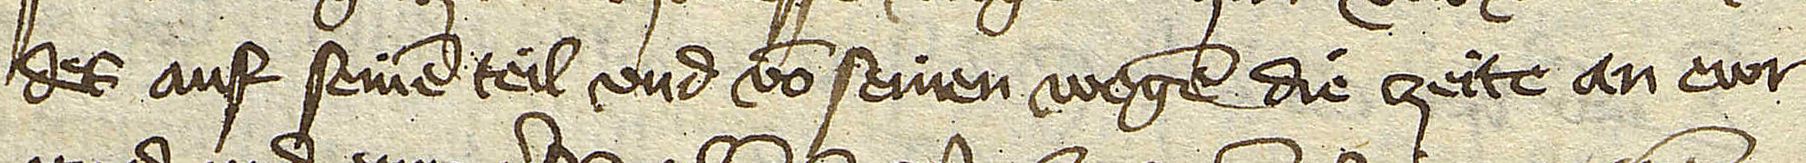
des auf ſeine* teil vnd vo* ſeinen wege* die cʒeite an ewr
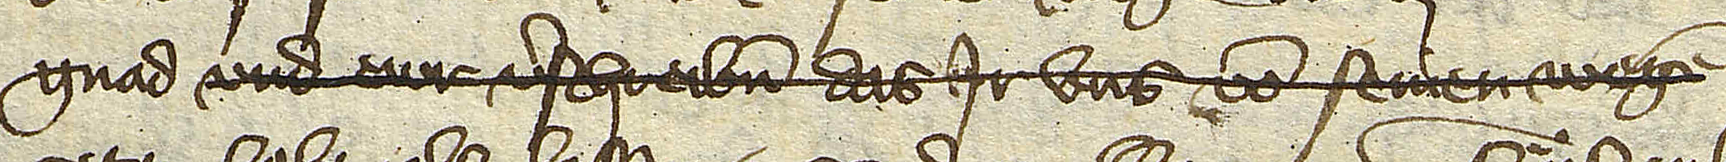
gnad vnd ewr v*ſchreibn* das Ir vns vo* ſeinen wege*
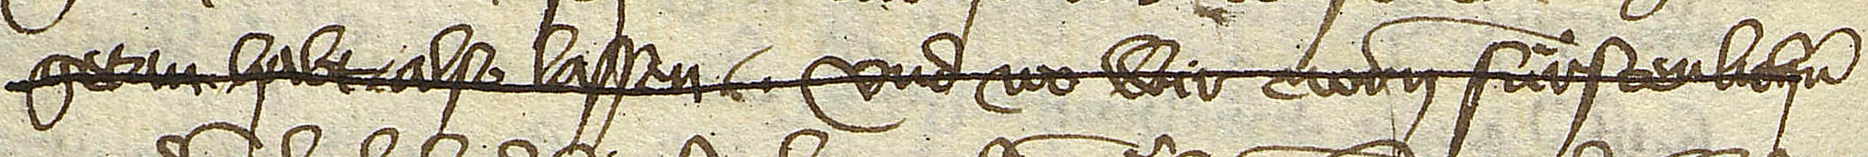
getan habt / alſo laſſen / . vnd wo wir ewrn* fürſtenlichn*
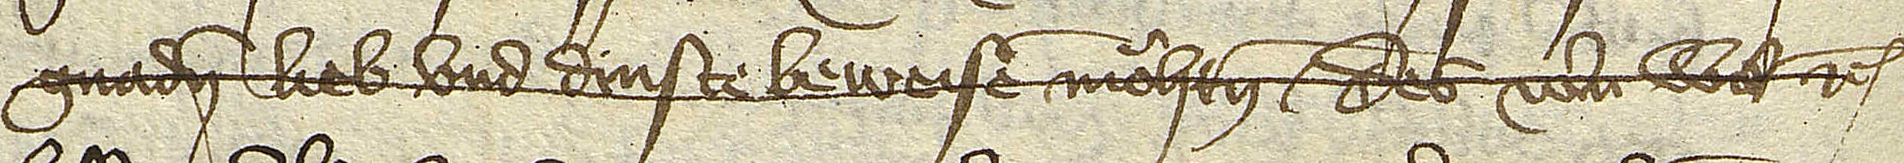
gnadn* lieb vnd dinſte beweiſe* möhtn* / Des w*n wo ec*
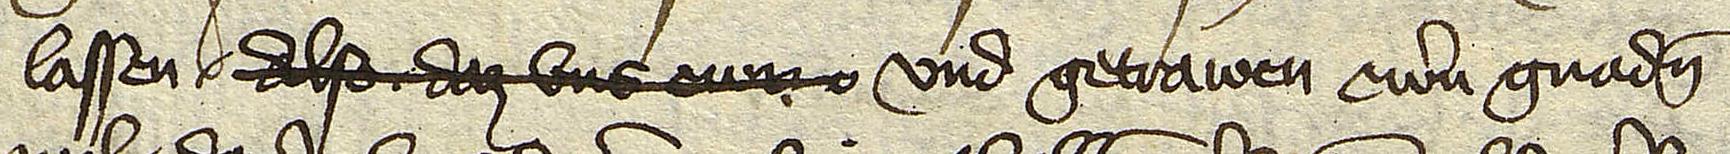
laſſen / Alſo / daʒ vns ewrn vnd getrawen ew*n gnadn*
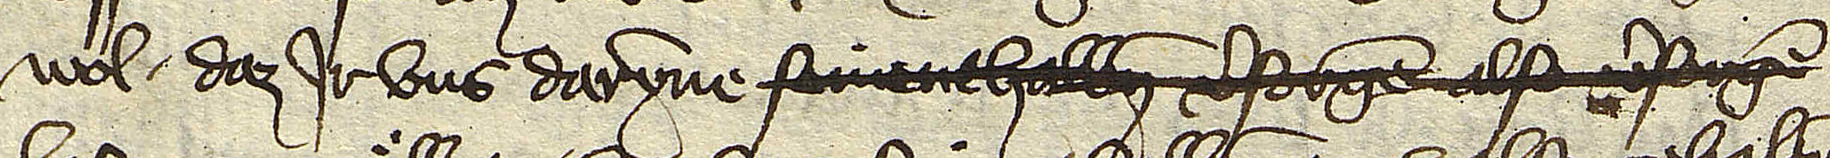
wol / daʒ Ir vns dar*yne ſeinenthalbn* v*ſorge* alſo v*ſorge*
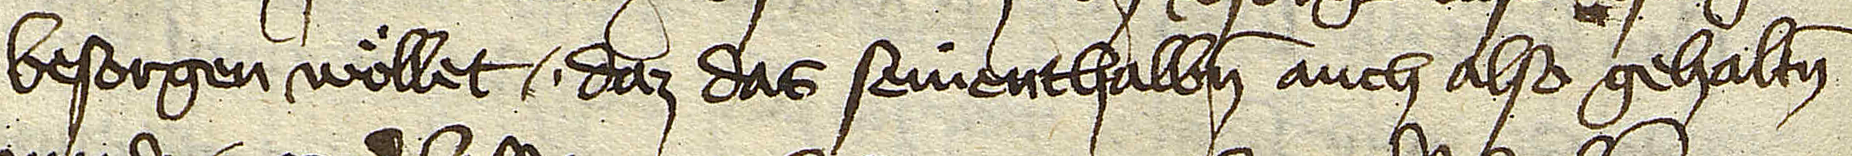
beſorgen wöllet / . daʒ das ſeinenthalbn* auch alſo gehaltn*
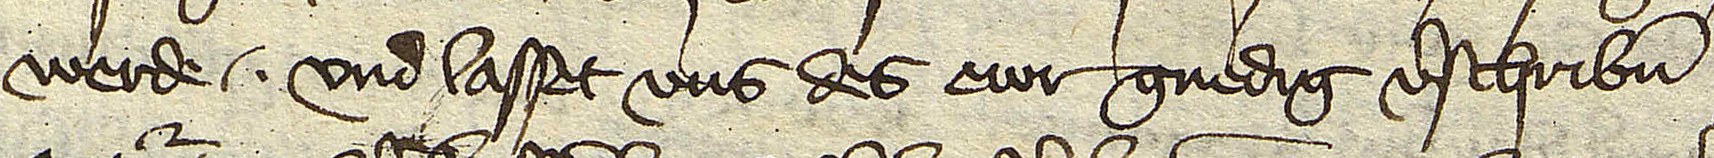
werde / . vnd laſſet vns des ewr gnedig v*ſchribn*
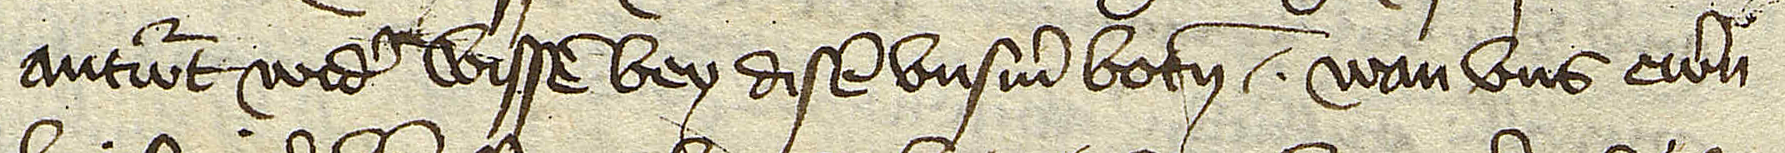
antwt* wid* wiſſe* bey diſe vnſm* botn* / . wan vns ew*n
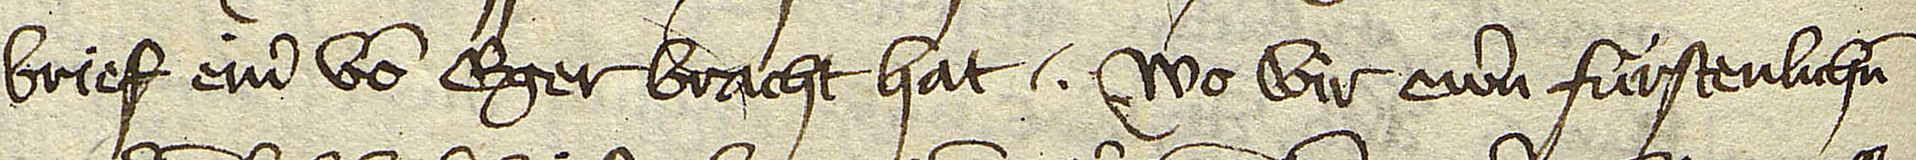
brief ein* vo* Eger bracht hat / . wo wir ew*n fürſtenlichn*
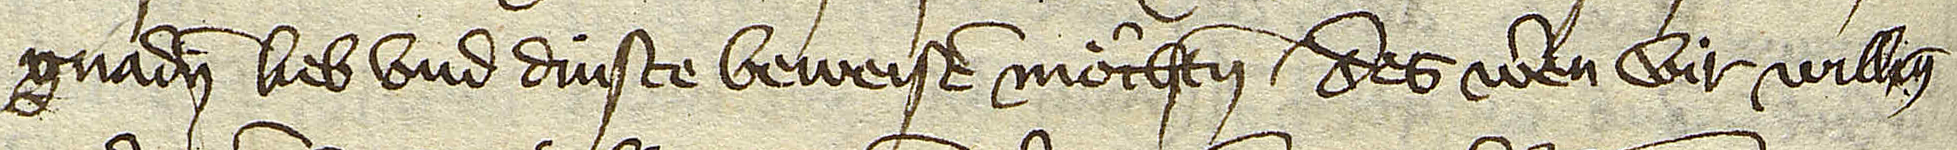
gnadn* lieb vnd dinſte beweiſe* möchtn* / Des w*en wir willig
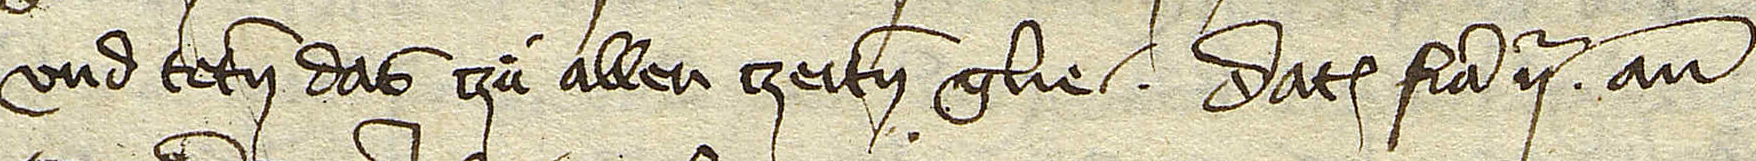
vnd tetn* das cʒü allen cʒeitn* g*ne / . Dat* fia* ii* . an*
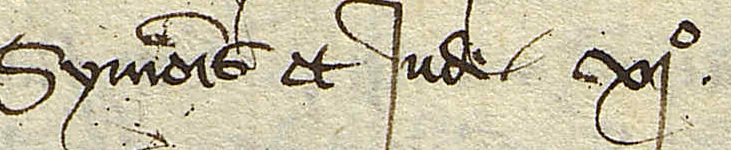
Symois* et Iude / xi* .
